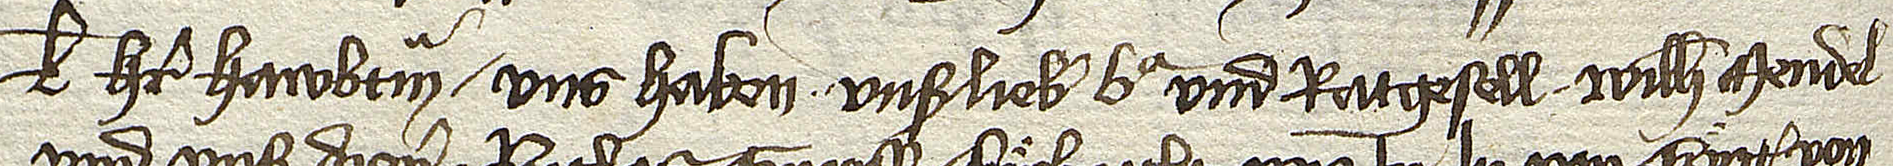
L* hr* hawbtm* / vns haben vnſ* lieb b* vnd Ratgeſell wilh* Mendel
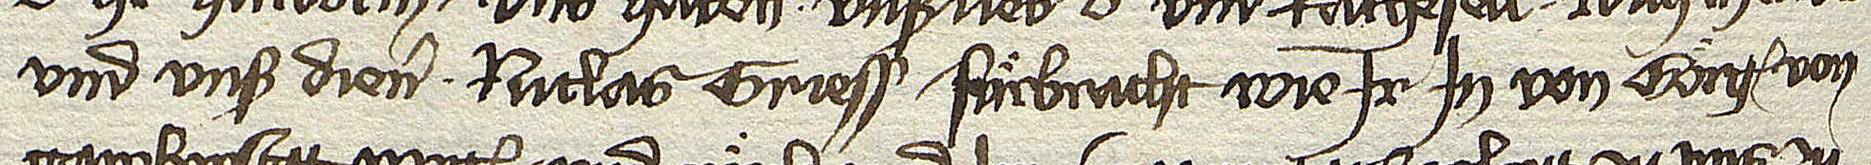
vnd vnſ* dien* Niclas Grieſſ / fürbracht wie Ir In von Görg* von
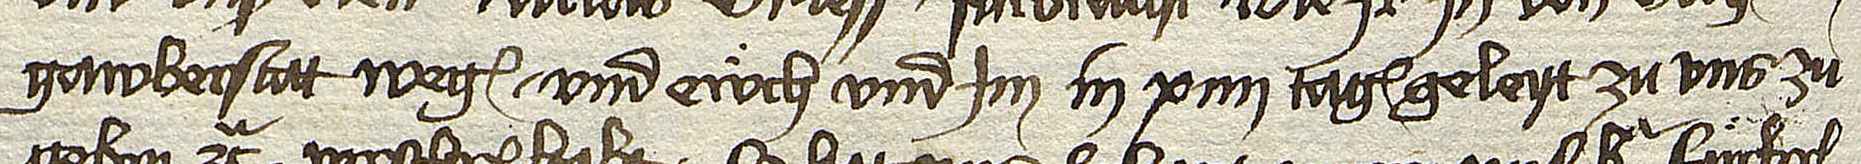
gawberſtat weg* / vnd eẅch vnd Im in xiiii tag* geleyt cʒu vns cʒu
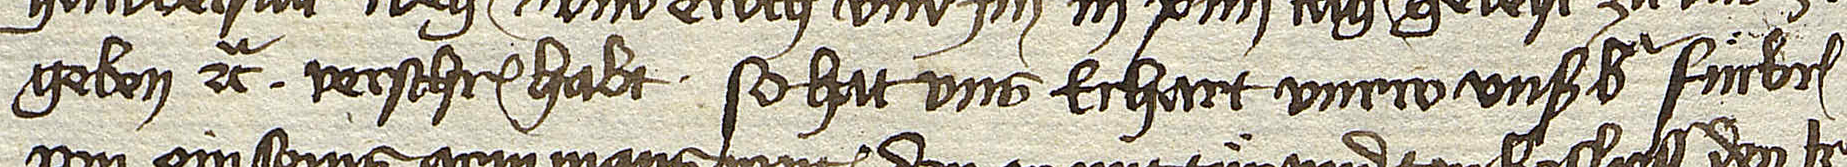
geben ec* . verſchr* habt ſo hat vns Erhart vnrw vnſ* b* fürbr*
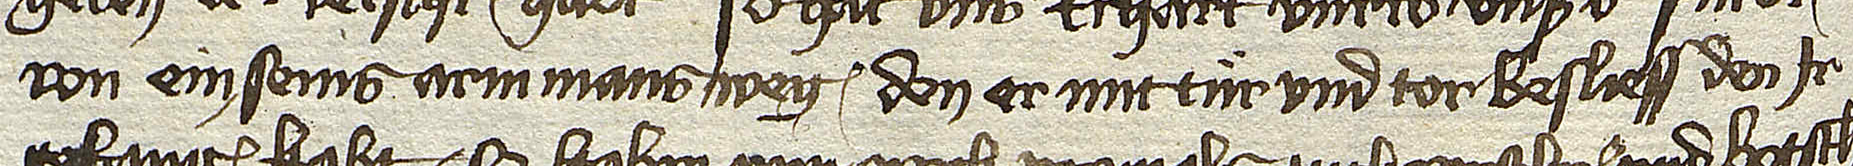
von ein ſeins arm mans weg* den er mit tür vnd tor beſlieſſ den Ir
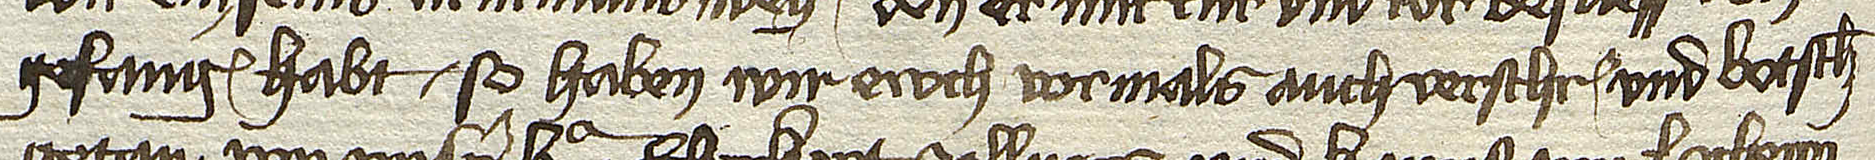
gefang* habt / ſo haben wir ewch vormals auch verſchr* vnd botſch*
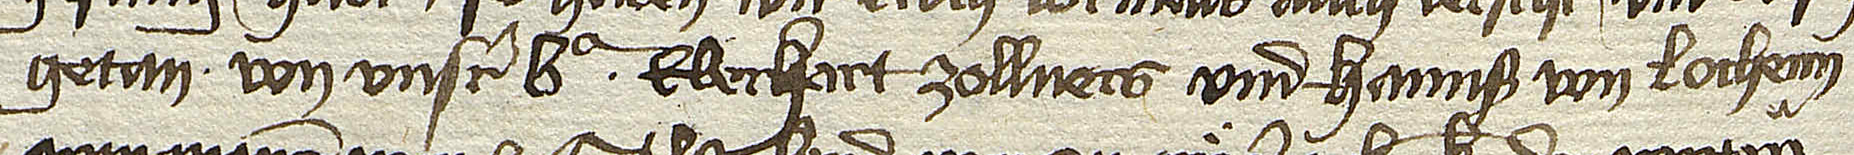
getan von vnſr* B* . Eberhart ʒollners vnd hannſ* von Locheim
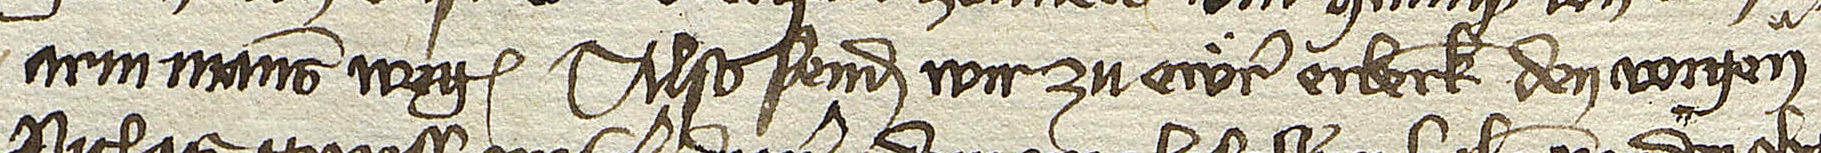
arm manns* weg* / Alſo ſend* wir cʒu eẅr* erberk* den vorgen
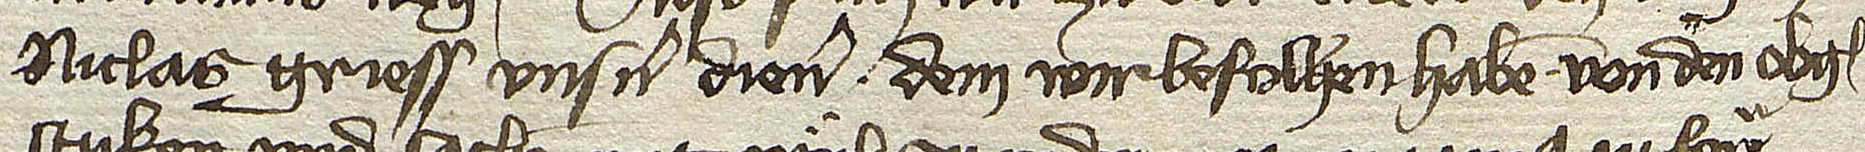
Niclas grieſſ vnſn* dien* . dem vor befolhen habe* von den obg*
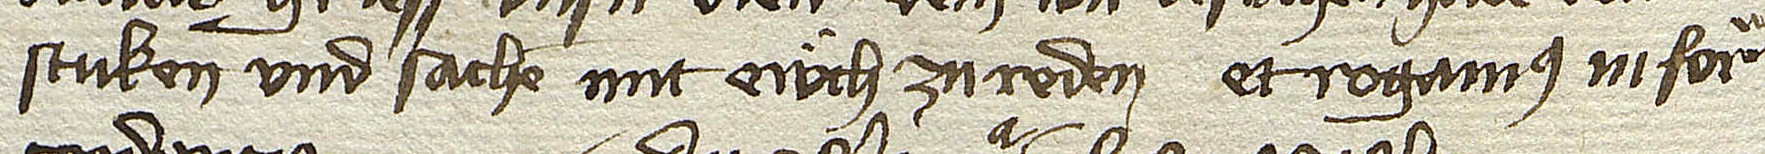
ſtuken vnd ſache* mit eẅch cʒu reden et rogam* in for*
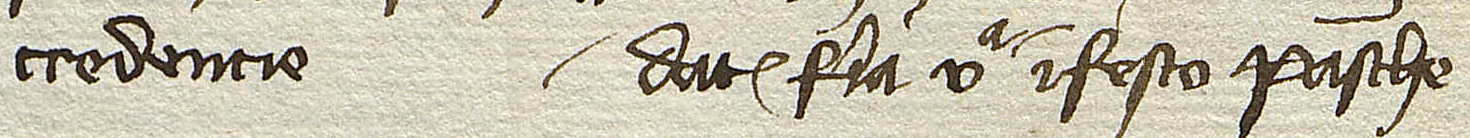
credencie / dat* fia* v* i* feſto Paſche
